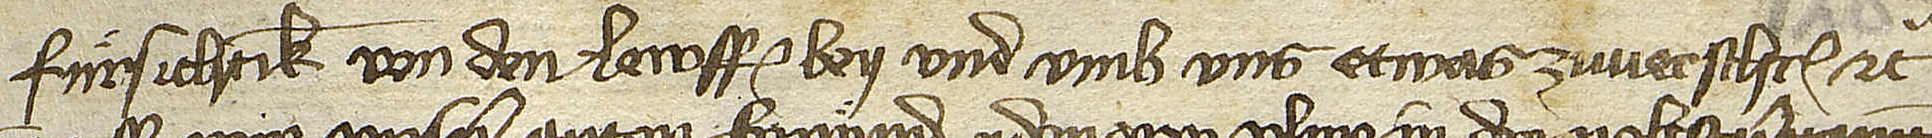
fürſichtik* von den lewff* bey vnd vmb vns etwas ʒuuerſchr* ec*
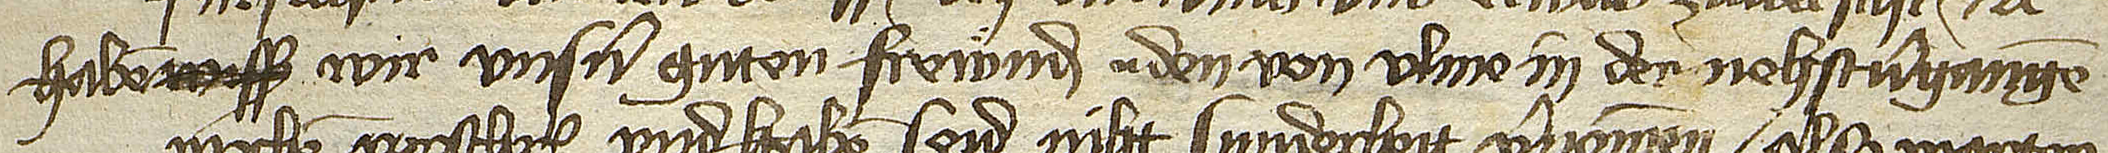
habe* wiſſ* wir vnſn* guten freẅnd* ~ den von vlme in der nehſtu*gange*
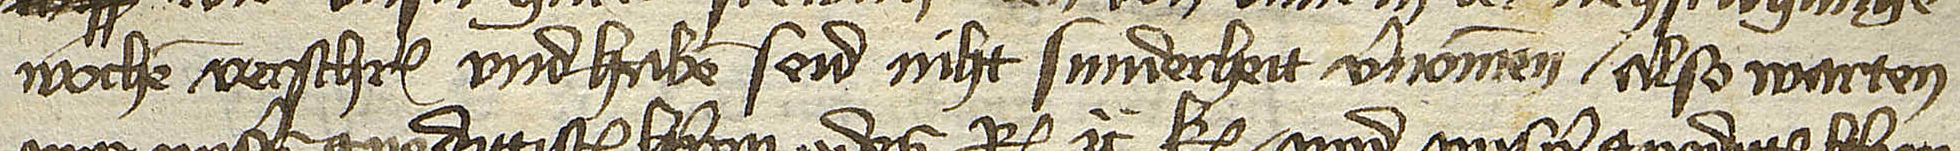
woche* verſchr* vnd habe* ſeid niht ſunderheit v*nom*en / alſo warten
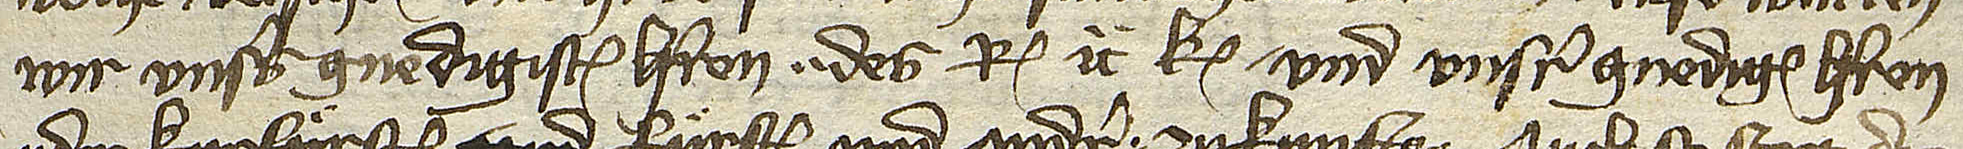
wir vnſs* gnedigiſt* hr*en ~ des R* ec* k* / vnd vnſr* gnedig* hr*en
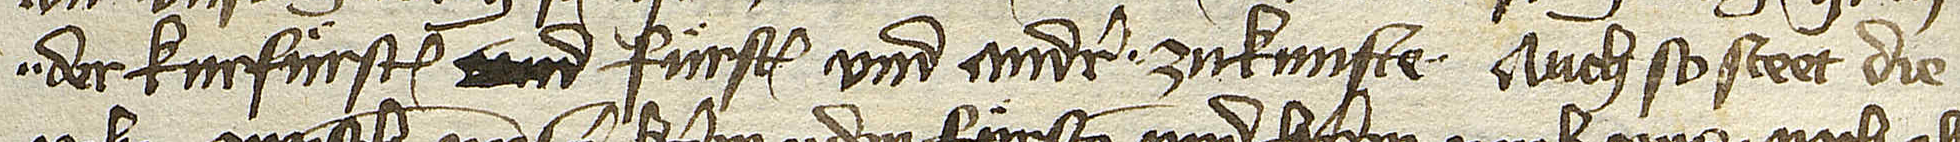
~ der kurfürſt* vnd fürſt* vnd andr* ʒukunfte . Auch ſo ſteet die
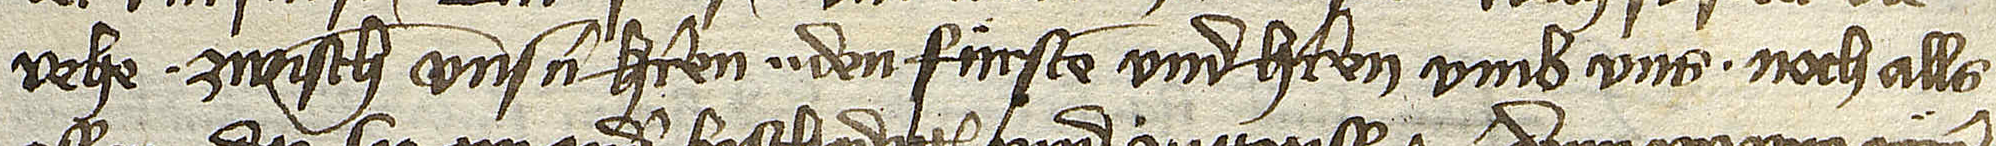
vehe . ʒwiſch* vnſn* hr*en ~ den fürſte* vnd hr*en vmb vns . noch alls
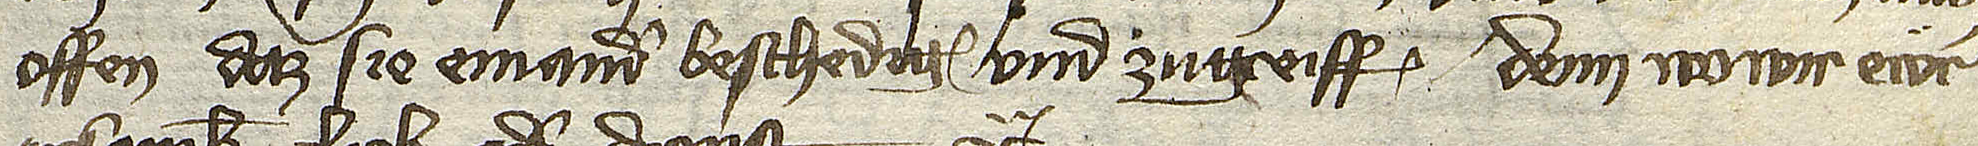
offen daʒ ſie einand* beſchedig* vnd ʒugreiff* denn wo wir eẅr
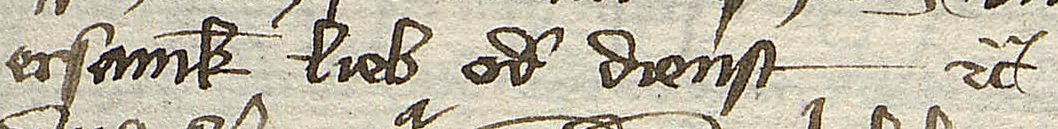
erſamk* lieb od* dienſt ec*
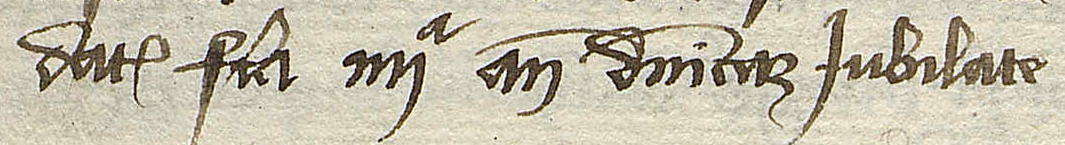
dat* fia* iiii* an* dinca* Iubilate
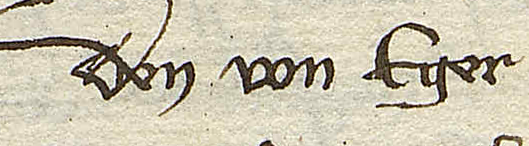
Den von Eger
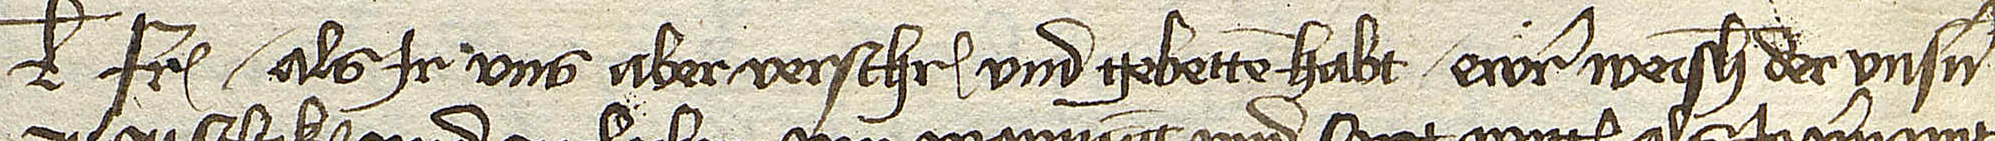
L* fr* / als Ir vns aber verſchr* vnd gebette habt / ewr* weiſh* der vnſn*
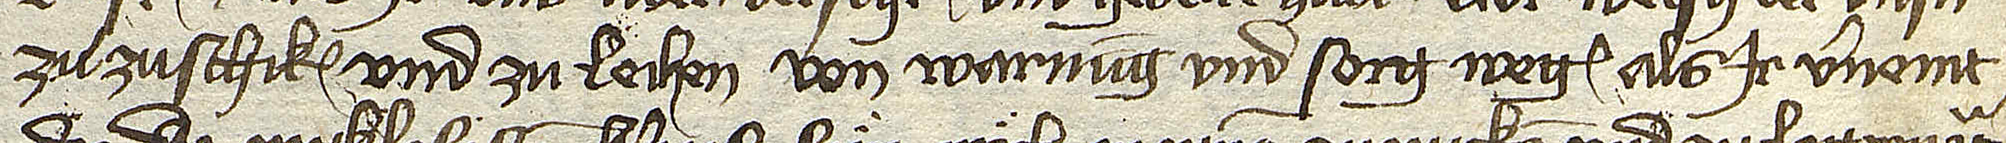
ʒu ʒuſchik* vnd ʒu leihen von warnug* vnd ſorg weg* als Ir v*nemt
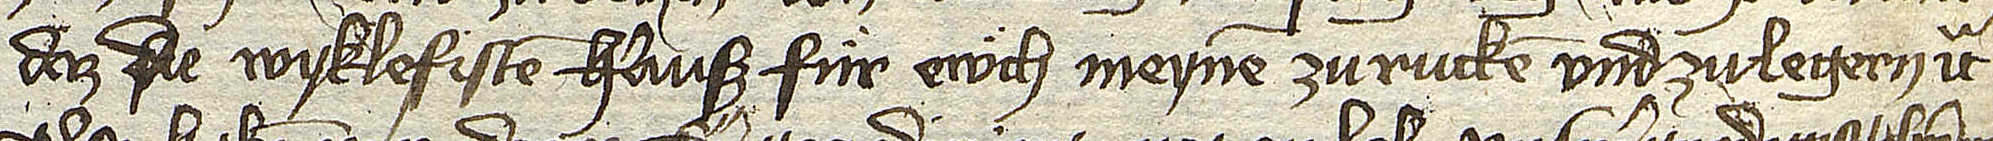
daʒ die wyklefiſte* h*auſʒ für eẅch meyne* ʒu rucke* vnd ʒulegern ec*
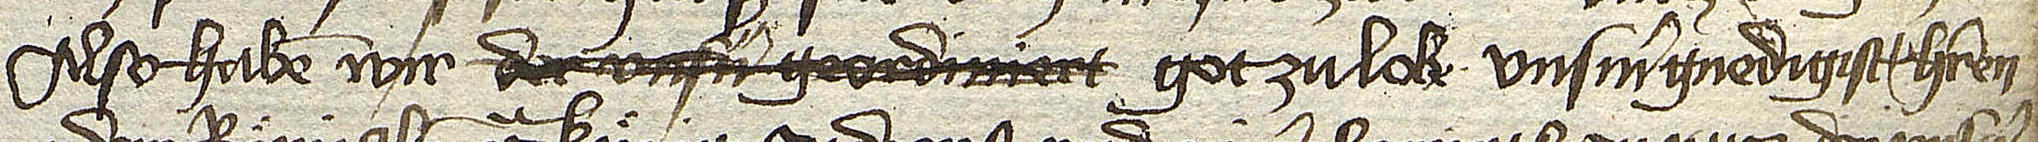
Alſo habe* wir der vnſn* geordiniert got ʒu lob . vnſm* gnedigiſt* hr*en
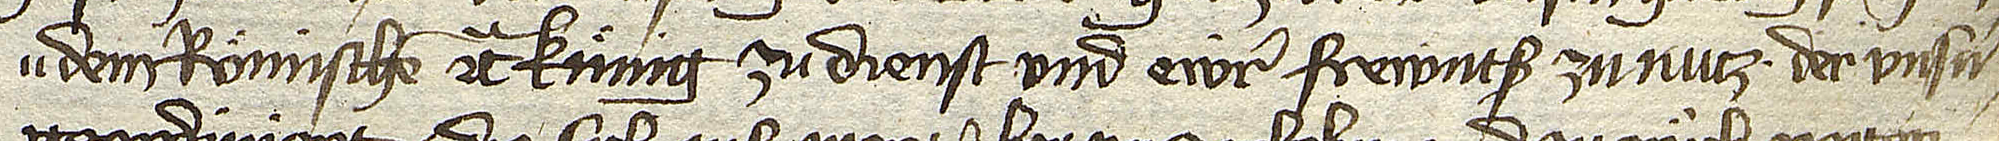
~ dem Römiſche* ec* künig ʒu dienſt vnd eẅr* frewntſ* ʒu nucʒ . der vnſn*
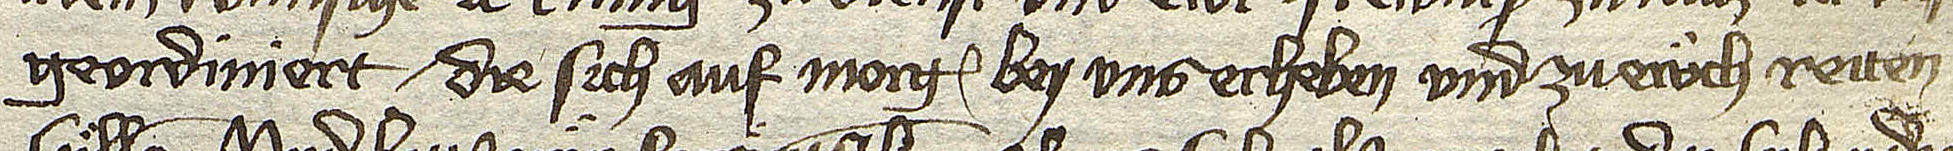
geordiniert / die ſich auf morg* bey vns erheben vnd cʒu eẅch reiten
